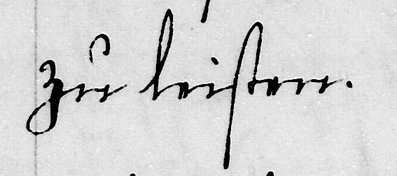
zu leisten.
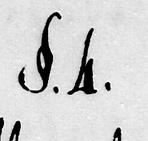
§. 4.
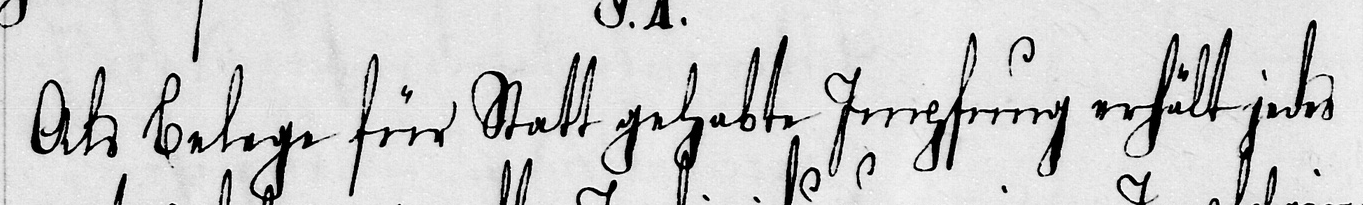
Als Belege für Statt gehabte Impfung erhält jed¬
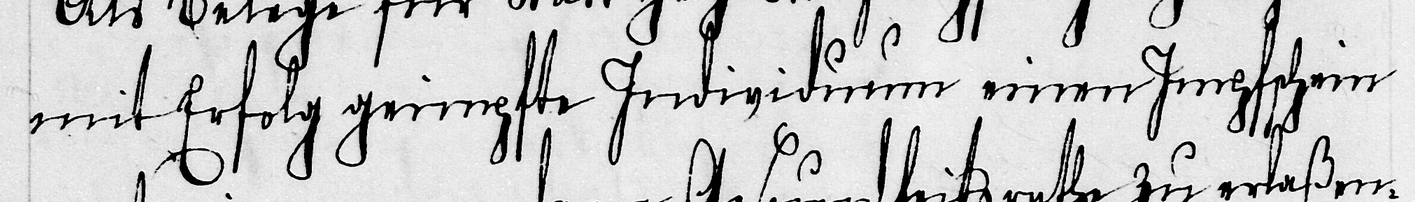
mit Erfolg geimpfte Individuum einen Impfschein
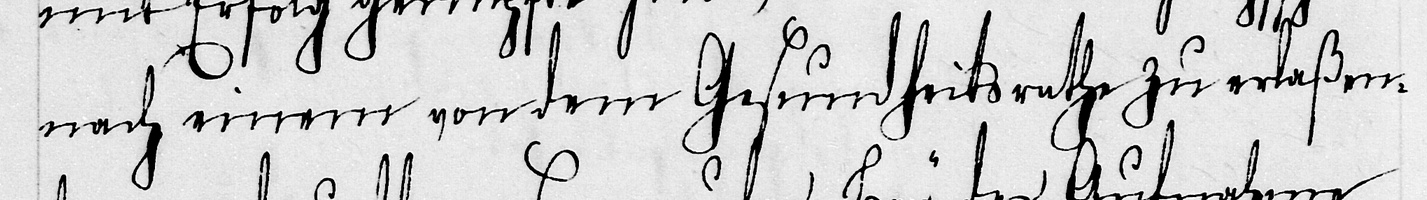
nach einem von dem Gesundheitsrathe zu erlaßen¬
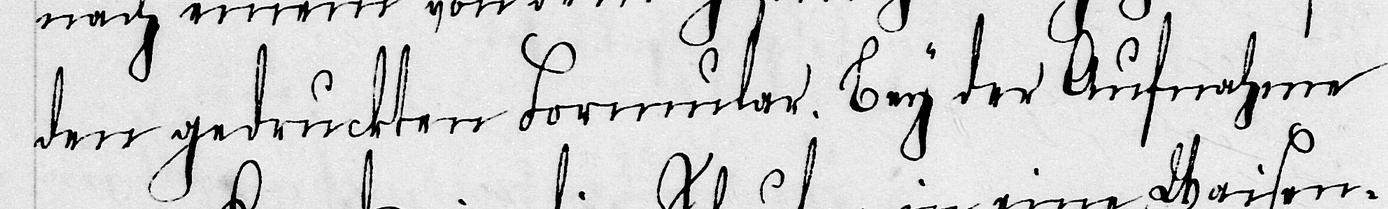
den gedruckten Formular. Bey der Aufnahme
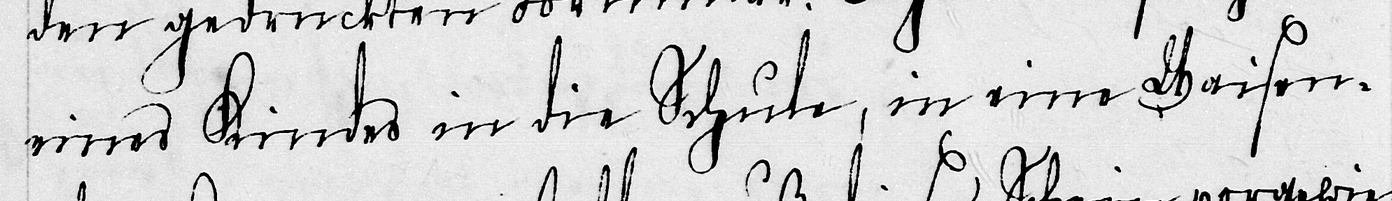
eines Kindes in die Schule, in eine Waisen-
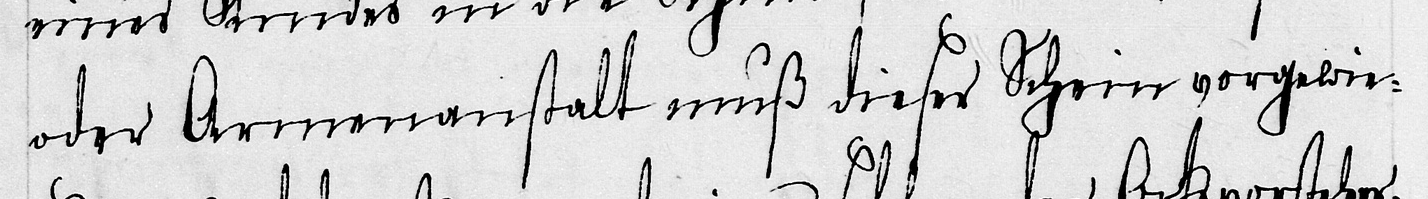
oder Armenanstalt muß dieser Schein vorgewie¬
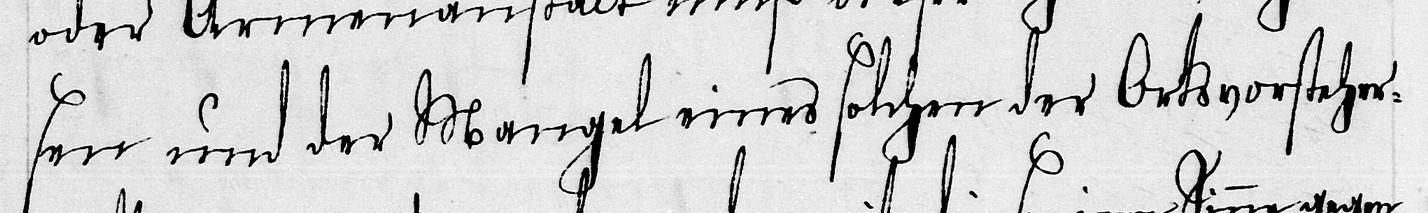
sen und der Mangel eines solchen der Ortsvorsteher¬
